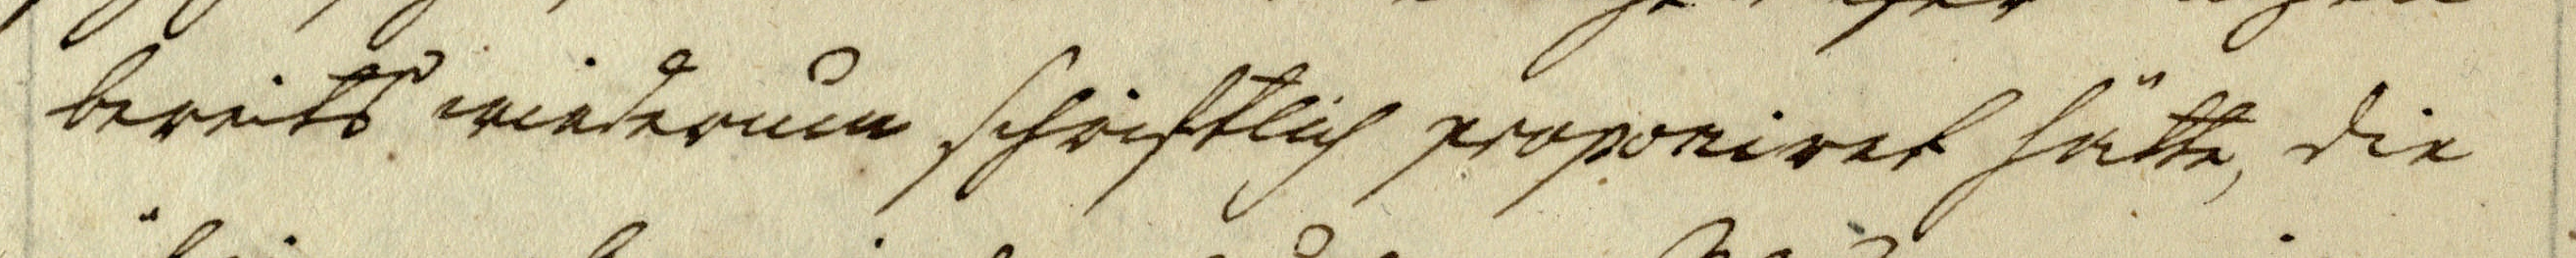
bereits wiederum schriftlich proponiret hätte, die
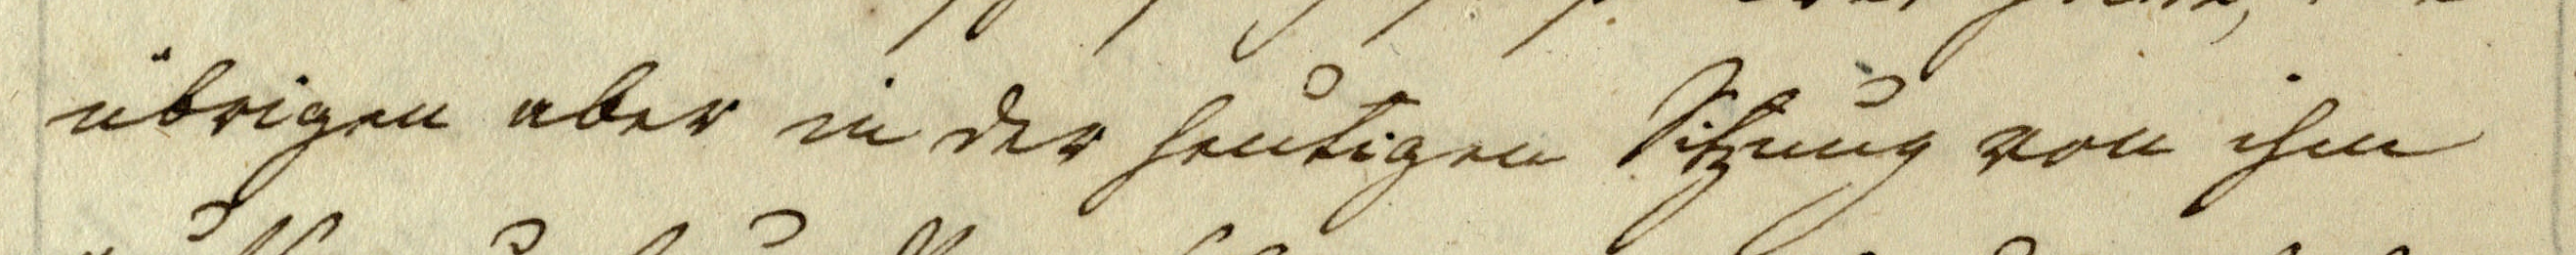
übrigen aber in der heutigen Sitzung von ihm
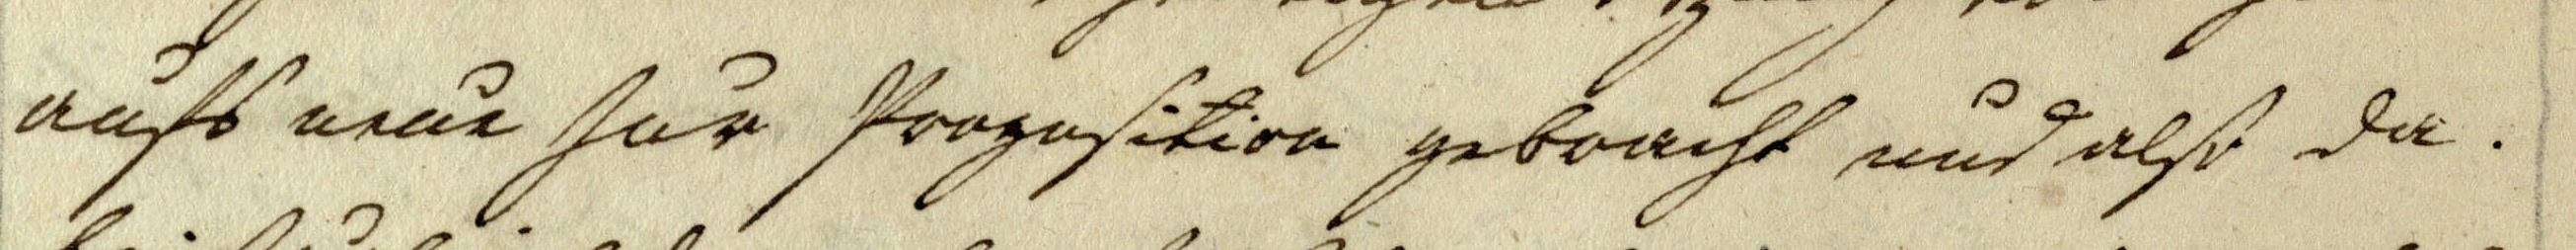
aufs neue zur Proposition gebracht und also da¬
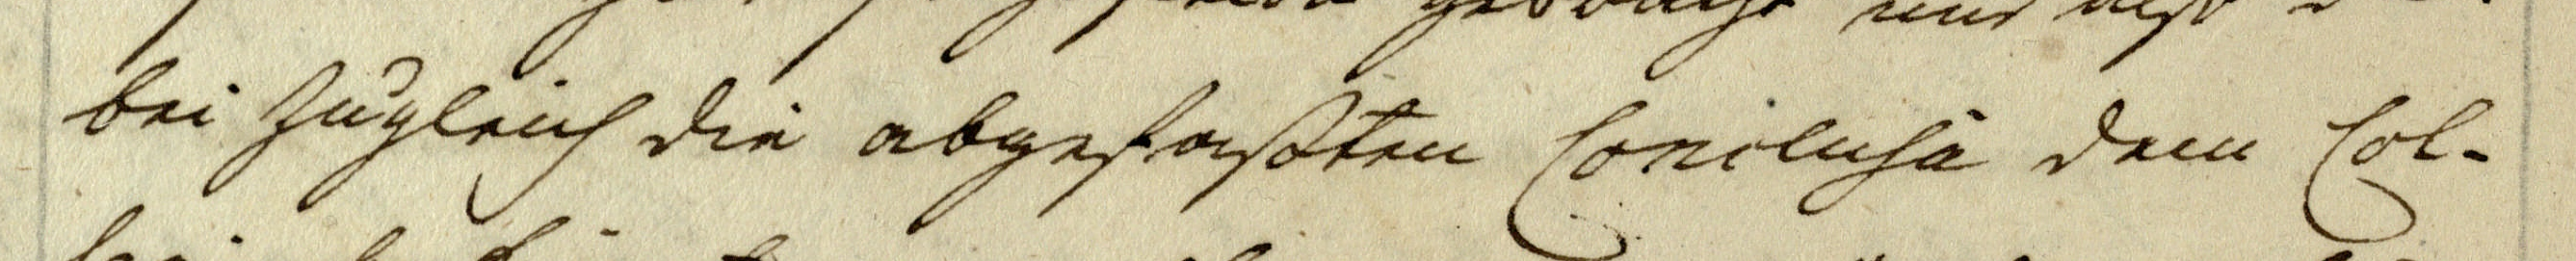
bei zugleich die abgefaßten Conclusa dem Col¬
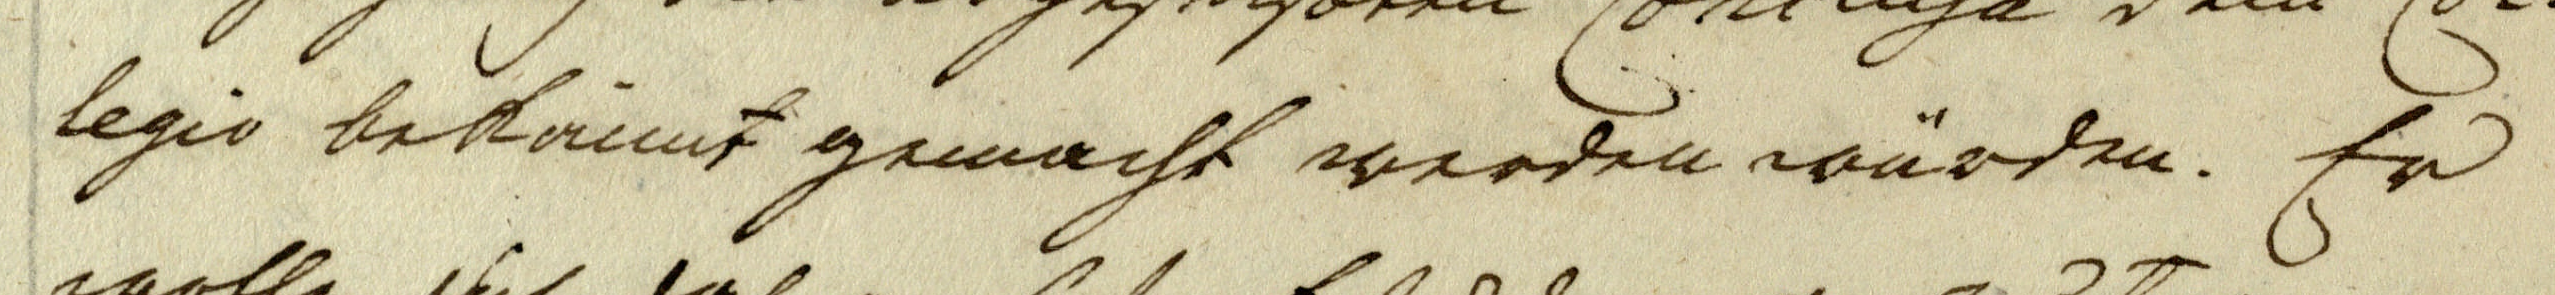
legio bekannt gemacht werden würden. Er
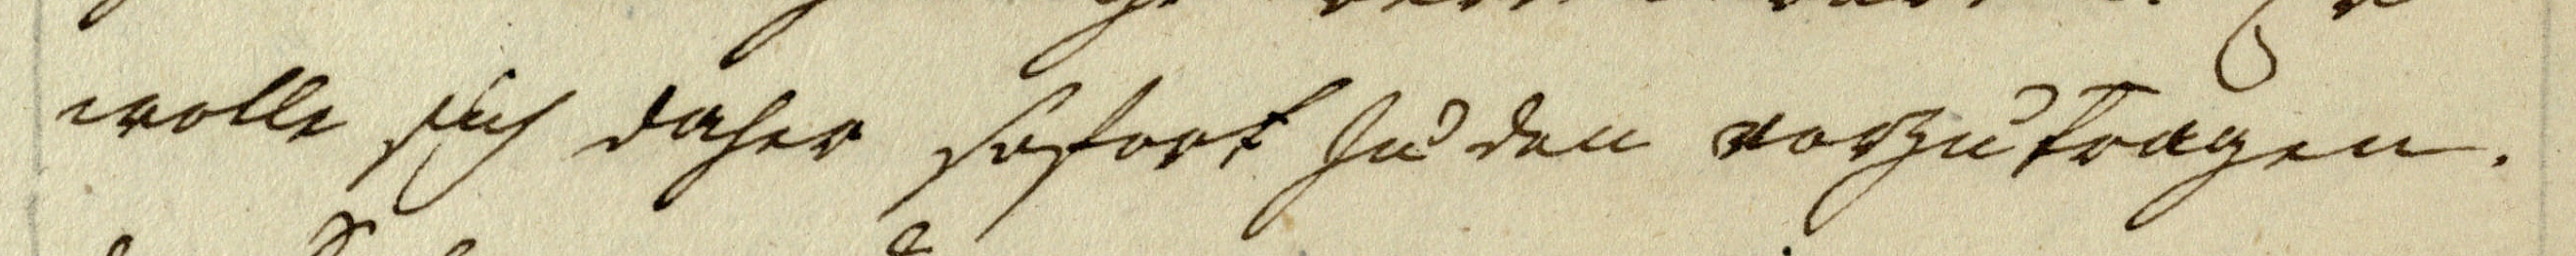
wolle sich daher sofort zu den vorzutragen¬
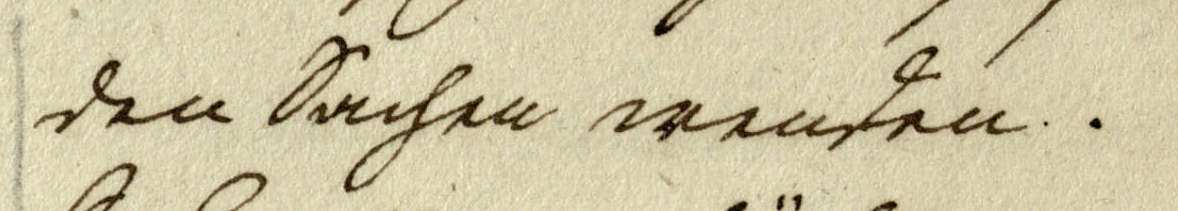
den Sachen wenden.
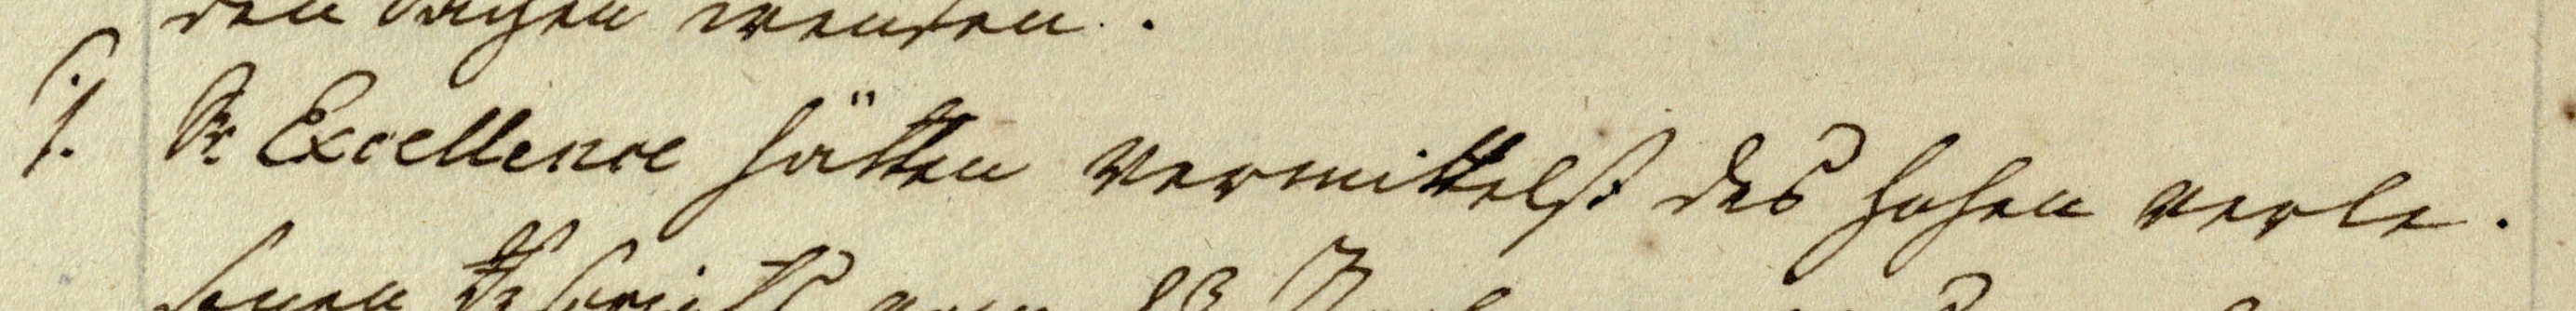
1. Sr Excellence hätten vermittelst des hohen verle¬
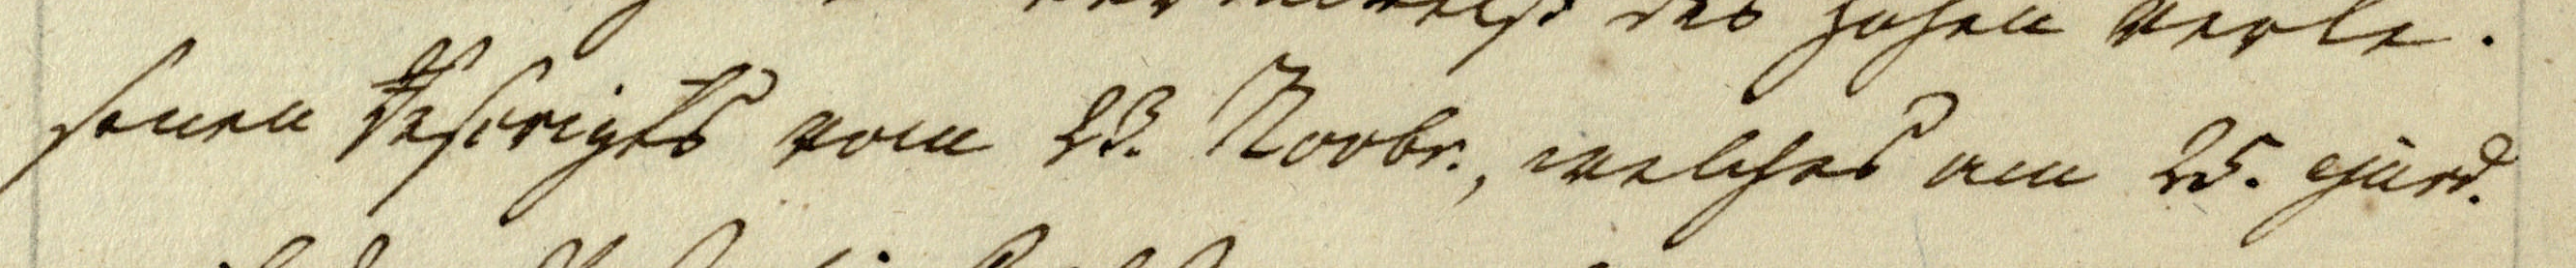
senen Rescripts vom 23. Novbr., welches am 25. ejusd.
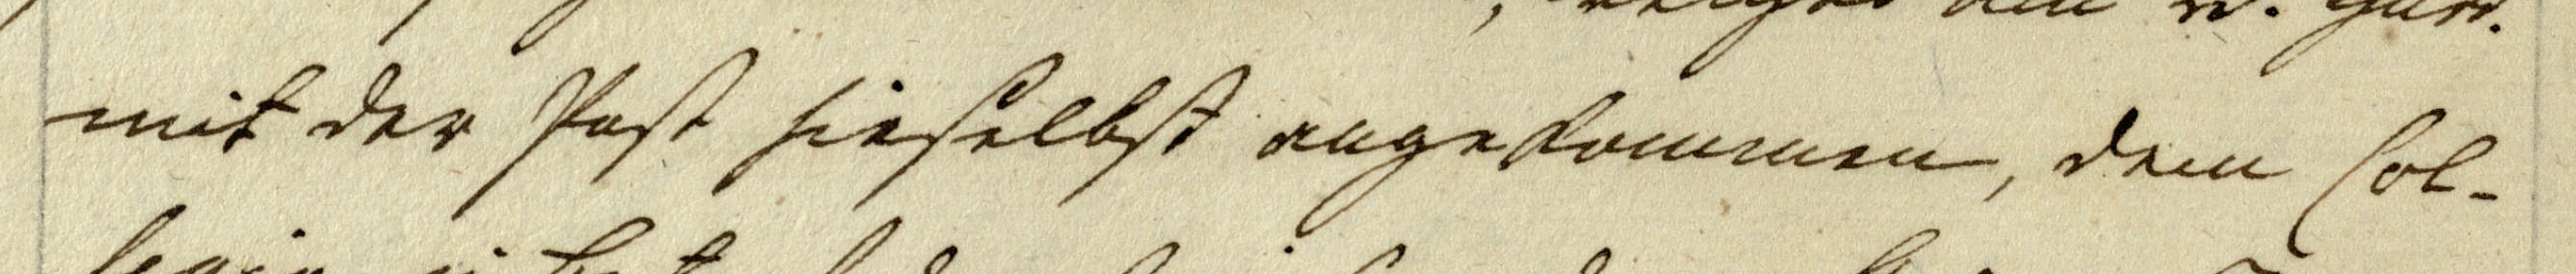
mit der Post hieselbst angekommen, dem Col
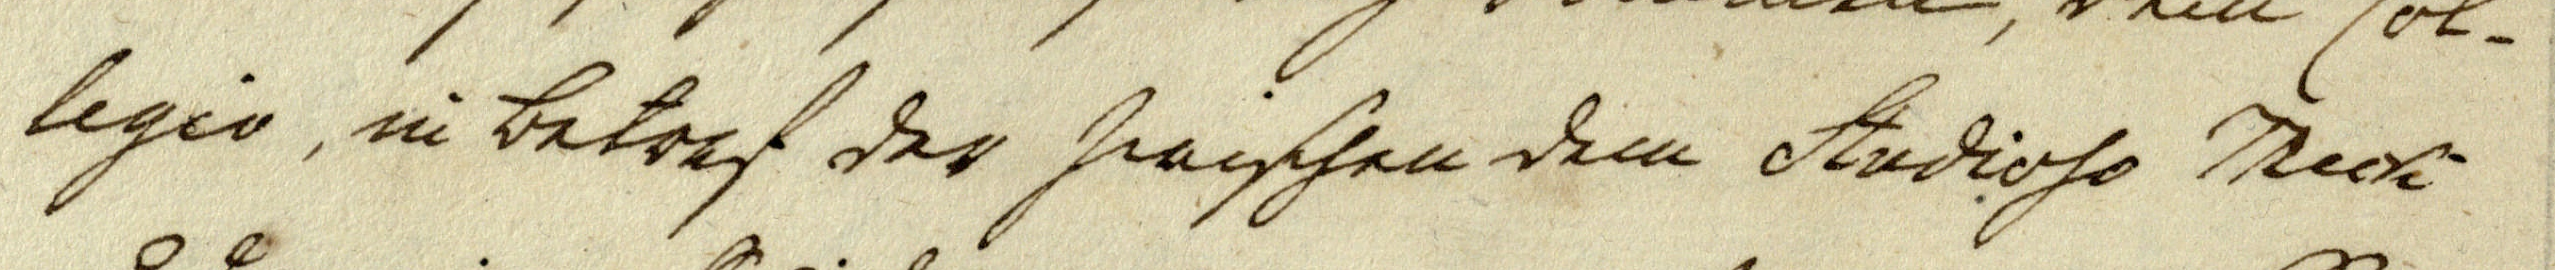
legio, in Betref der zwischen dem Studioso Meck
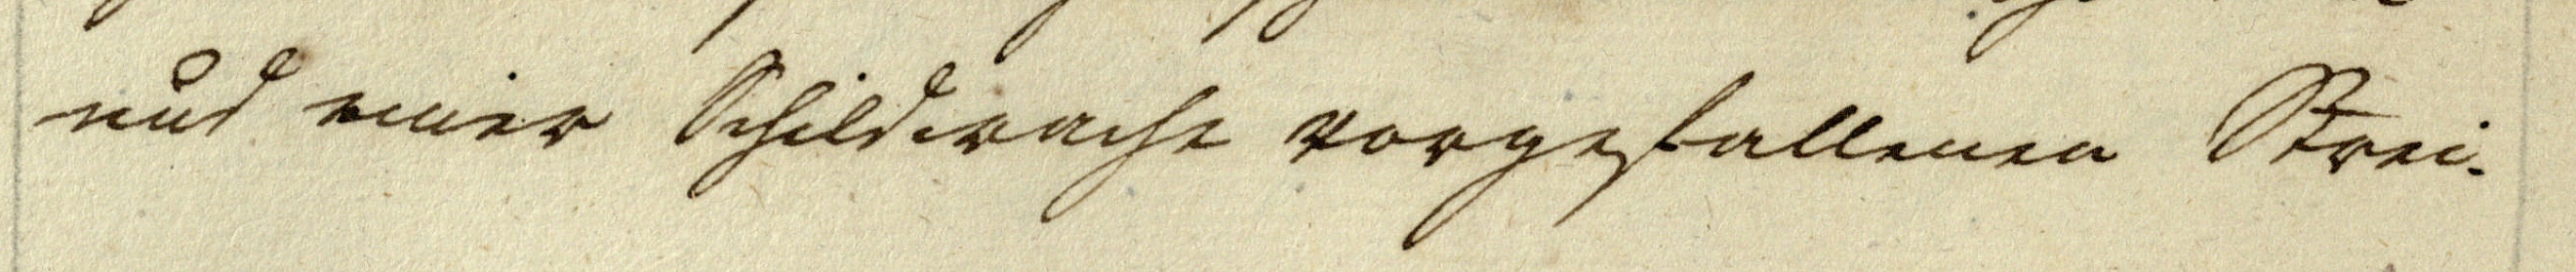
und einer Schildwache vorgefallenen Strei¬
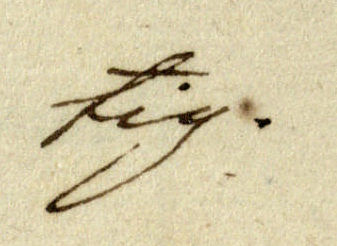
tig.
